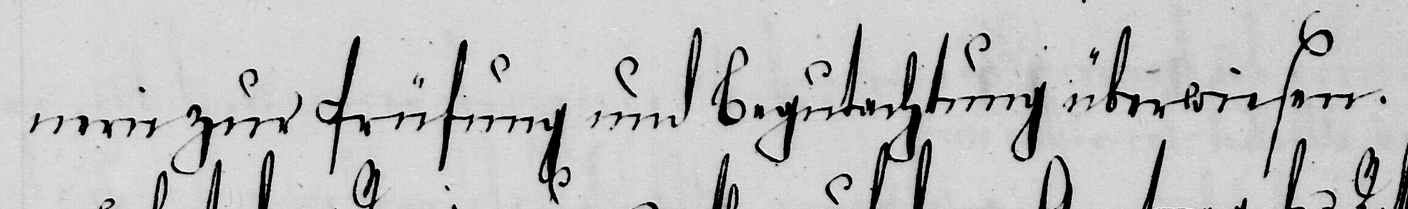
nern zur Prüfung und Begutachtung überwiesen.
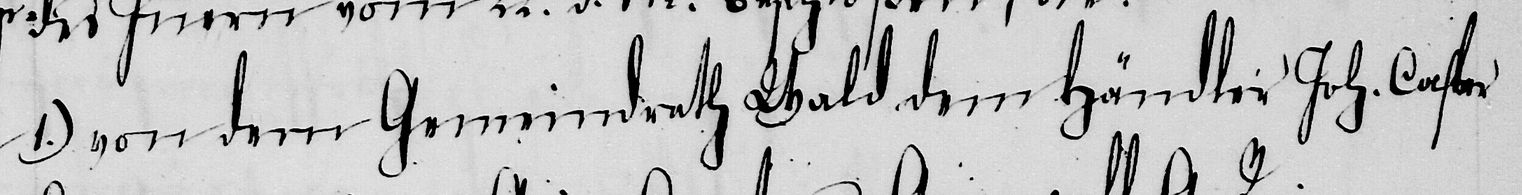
1.) von dem Gemeindrath Wald dem Händler Joh. Caspar
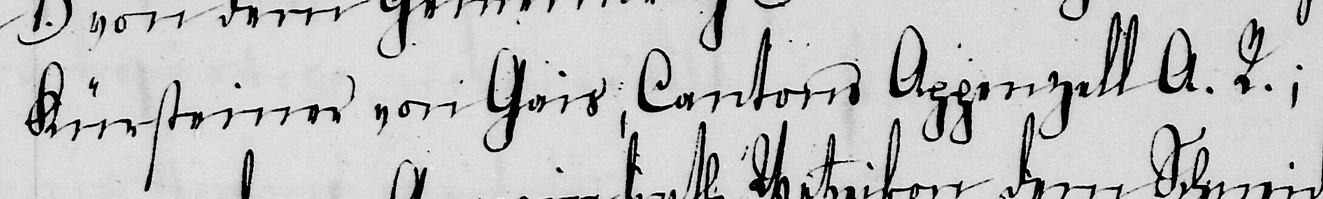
Kürsteiner von Gais, Cantons Appenzell A. R.;
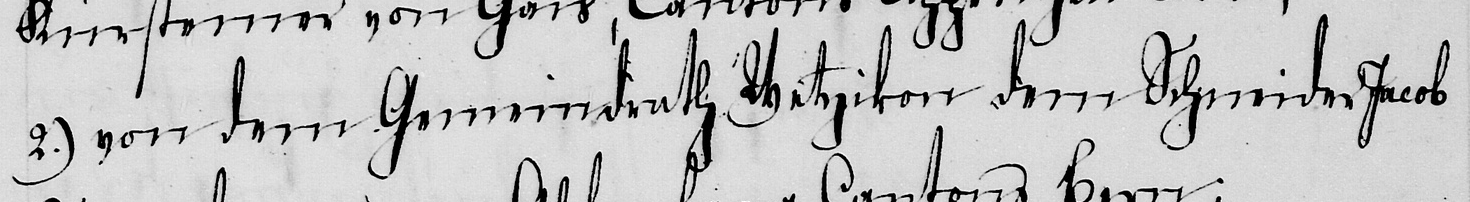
2.) von dem Gemeindrath Wetzikon dem Schneider Jacob
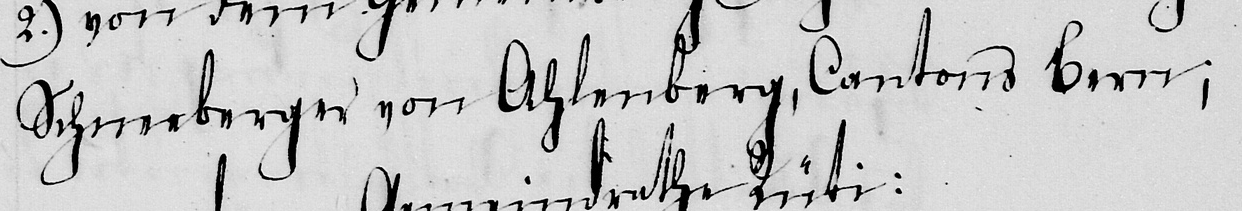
Schneeberger von Ahlenberg, Cantons Bern;
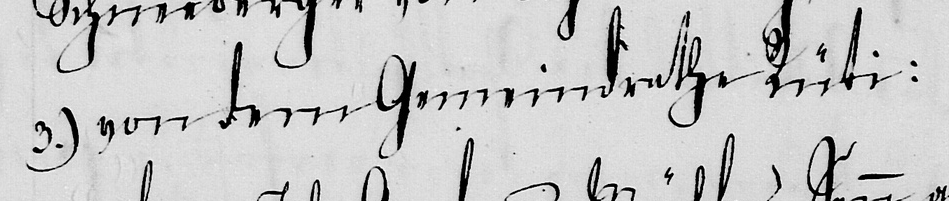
3.) von dem Gemeindrathe Rüti:
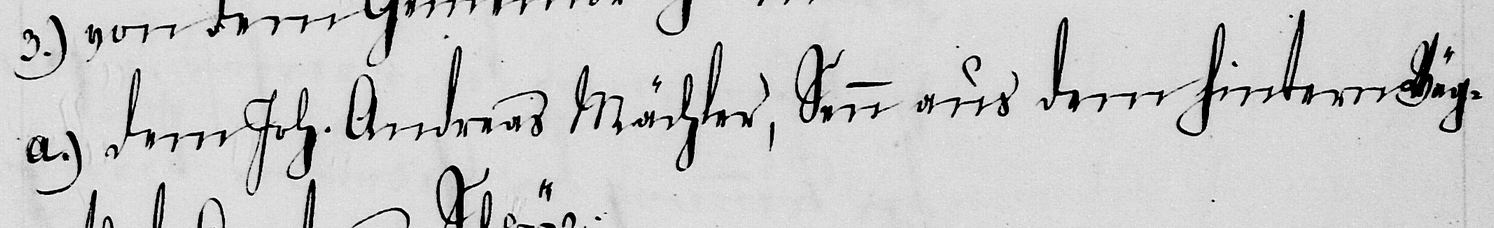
a.) dem Joh. Andreas Mächler, Senn aus dem hintern Wäg¬
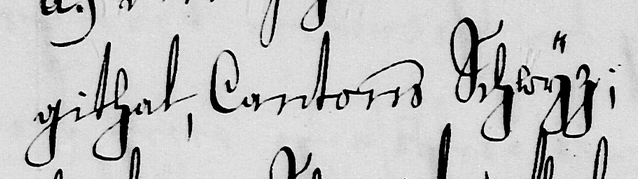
githal, Cantons Schwyz;
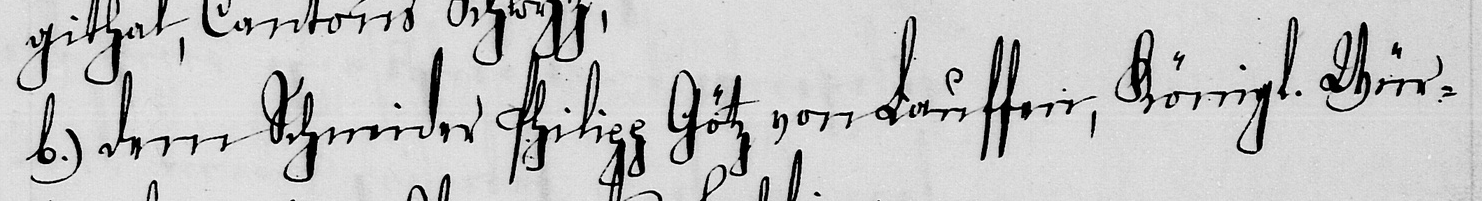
b.) dem Schneider Philipp Götz von Lauffen, Königl. Wür¬
